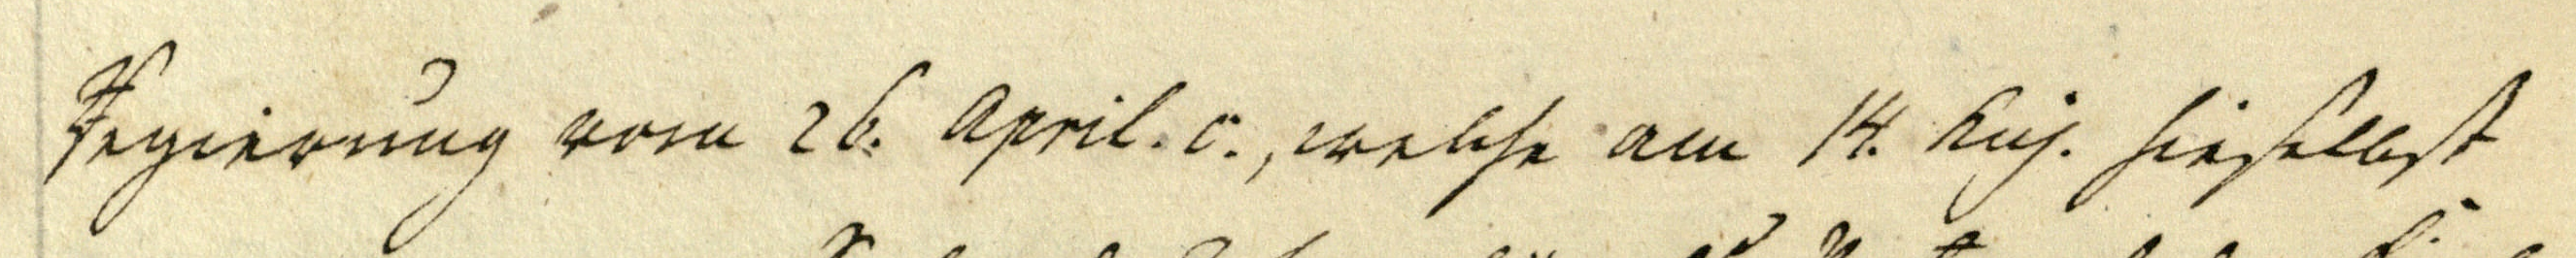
Regierung vom 26. April. c., welche am 14. huj. hieselbst
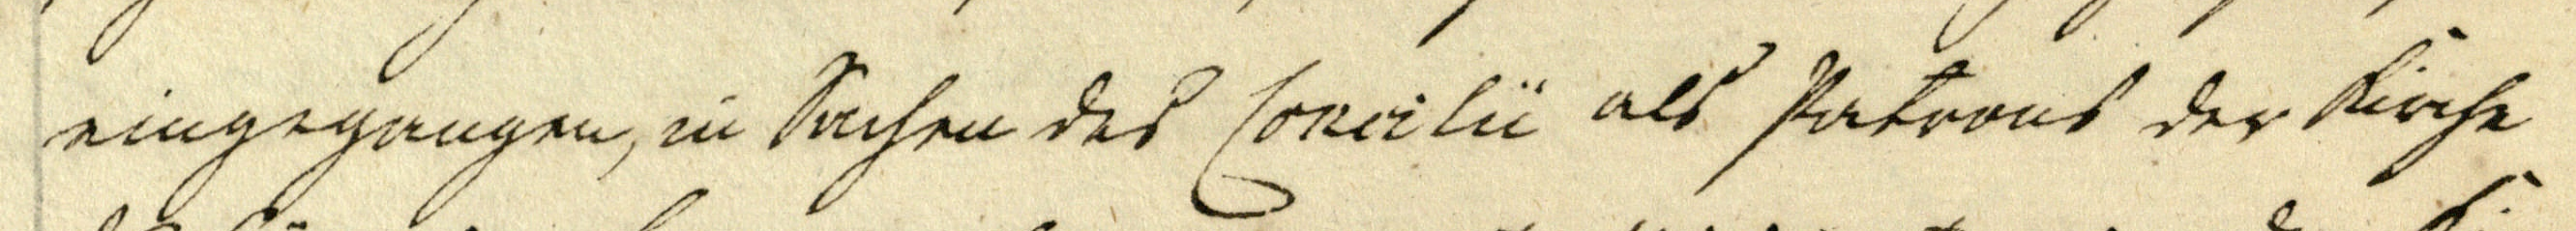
eingegangen, in Sachen des Concilii als Patrons der Kirche
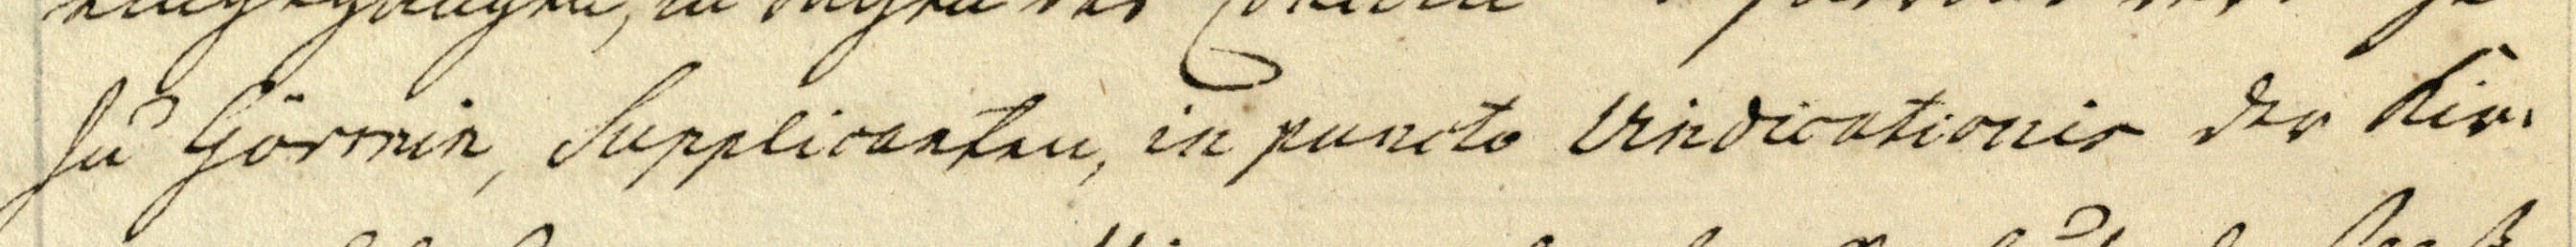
zu Görmin, Supplicanten, in puncto Vindicationis der Kir¬
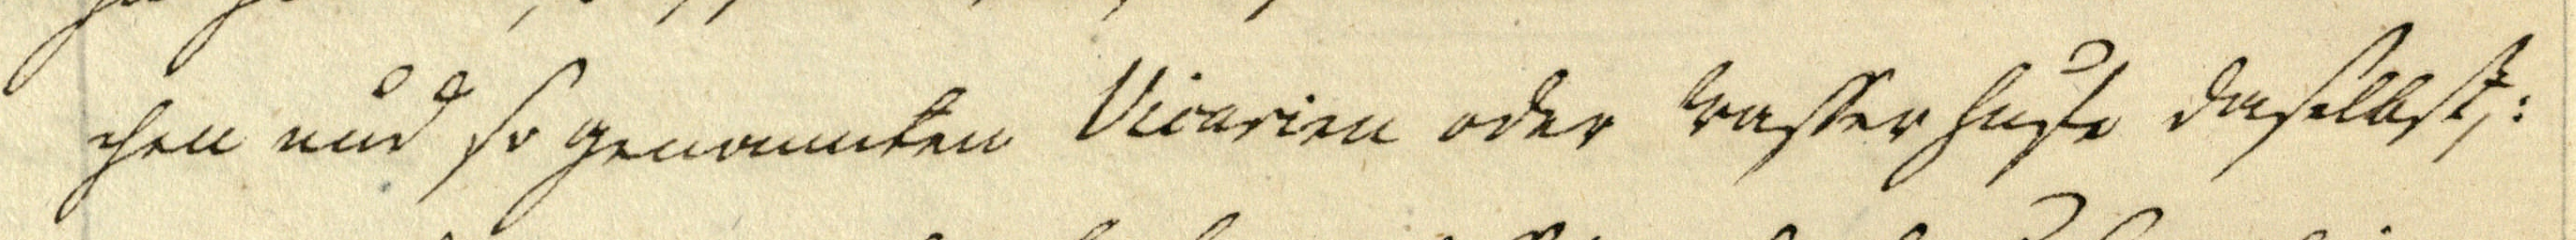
chen und so genannten Vicarien oder Wasserhufe daselbst,:
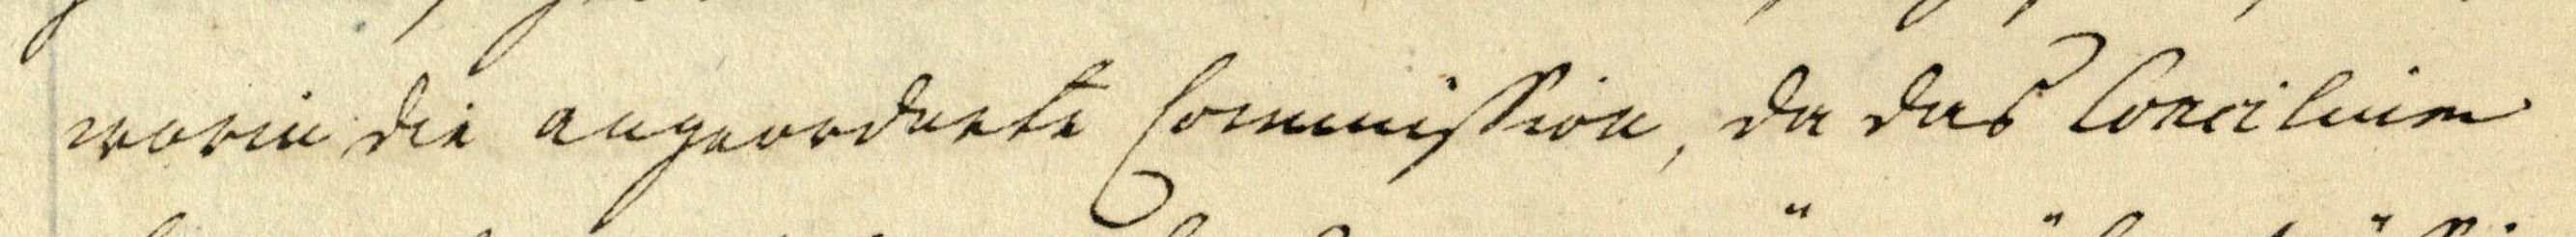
worin die angeordnete Commission, da das Concilium
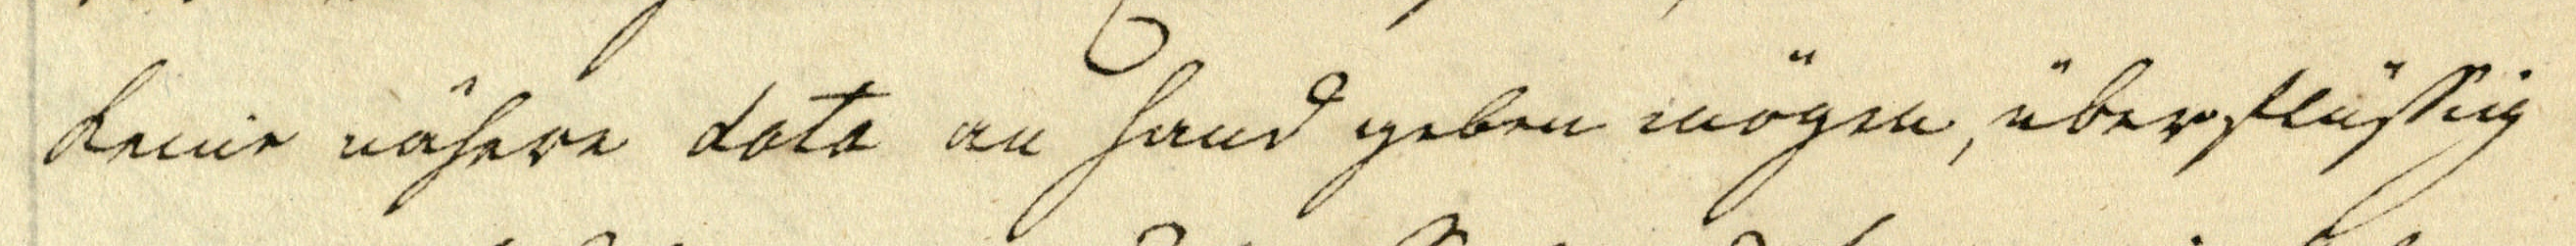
keine nähere data an hand geben mögen, überflüssig
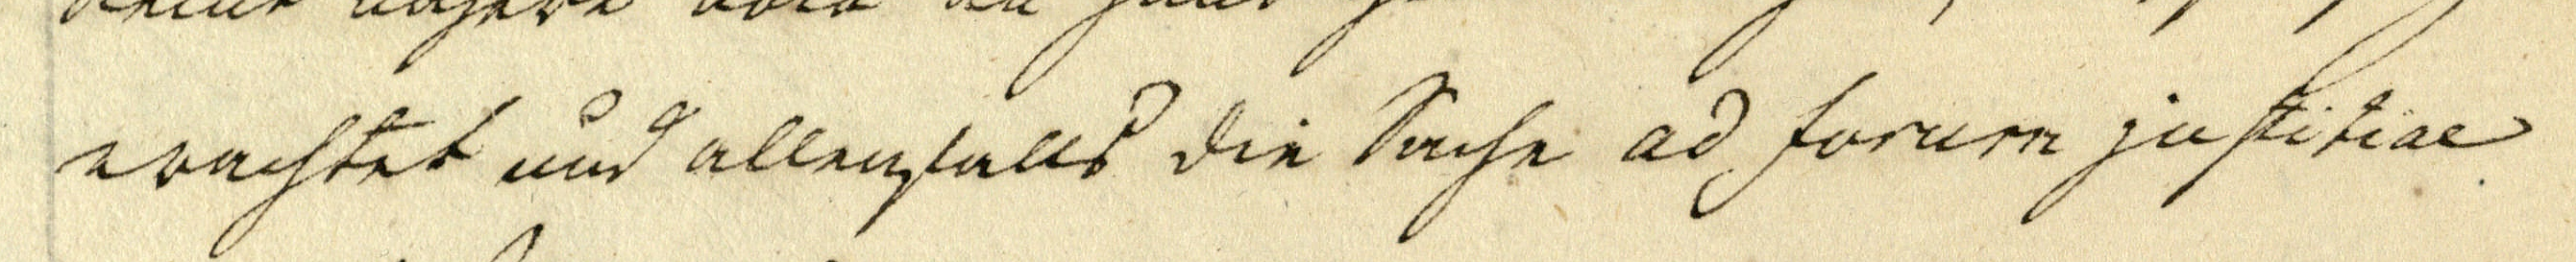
erachtet und allenfalls die Sache ad Forum justitiae
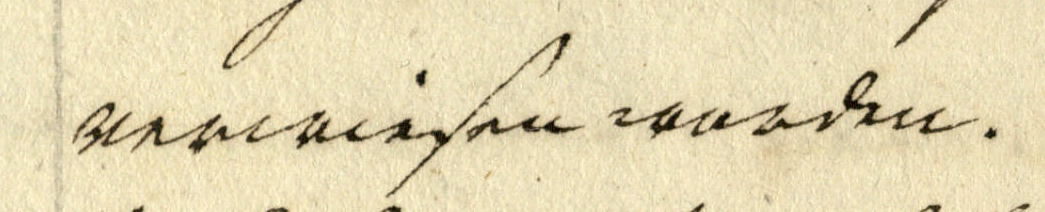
verwiesen worden.
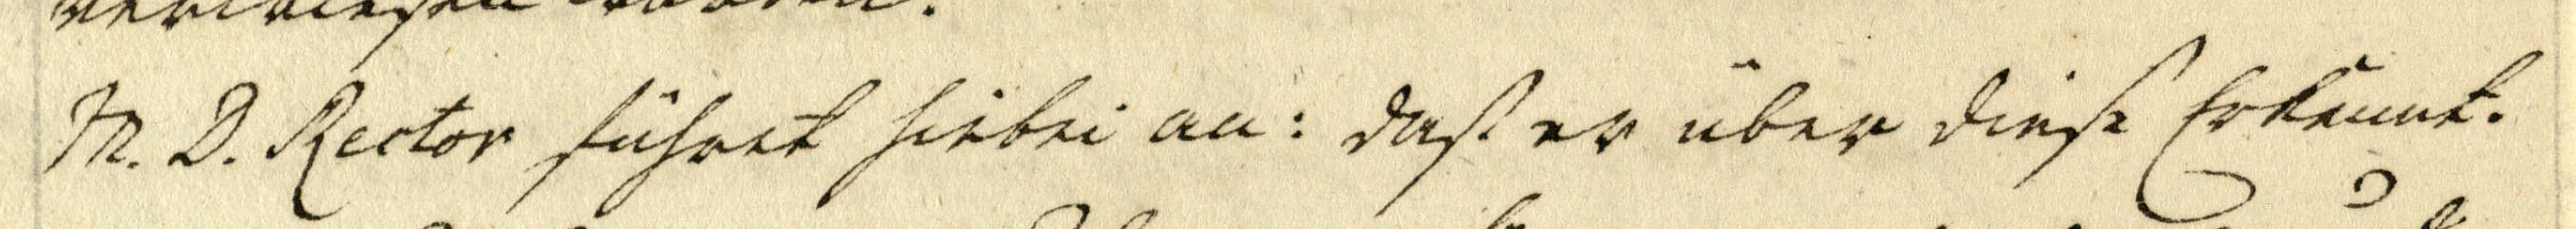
M. D. Rector führet hiebei an: daß er über diese Erkennt¬
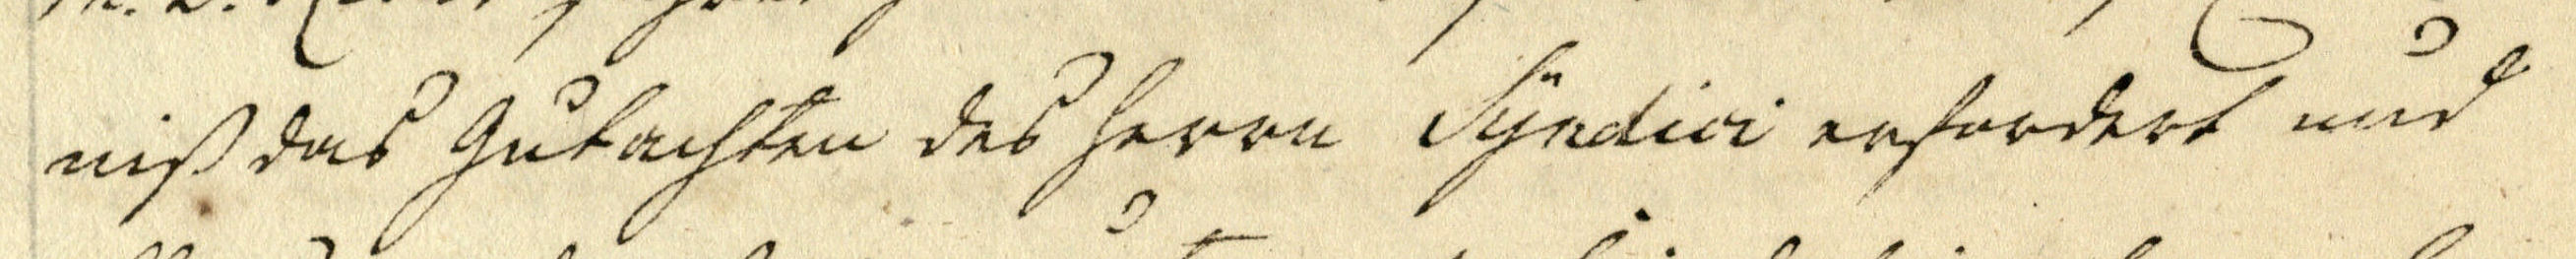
niß das Gutachten des herrn Sÿndici erfordert und
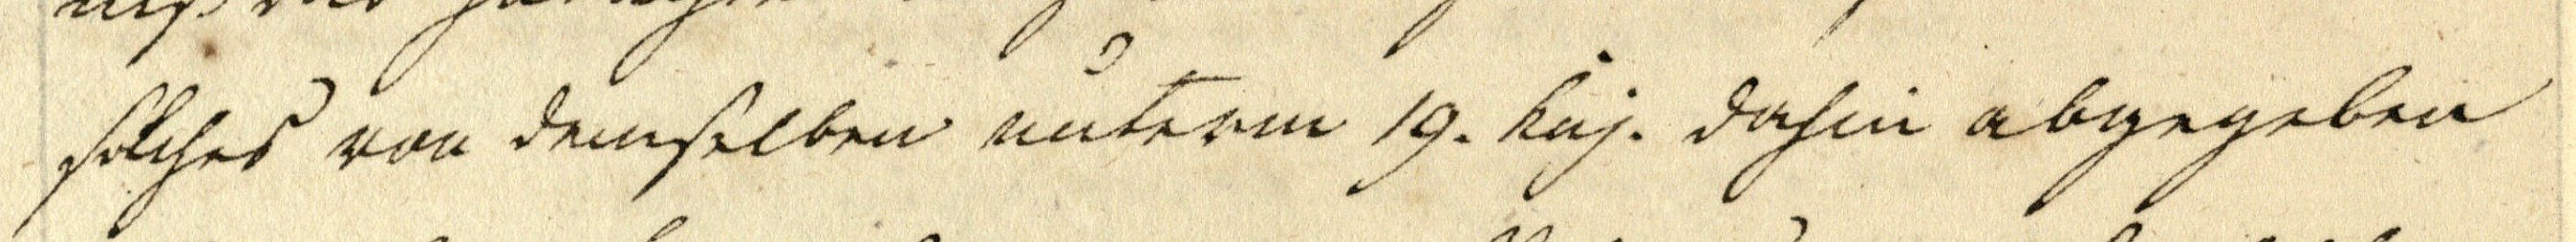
solches von demselben unterm 19. huj. dahin abgegeben
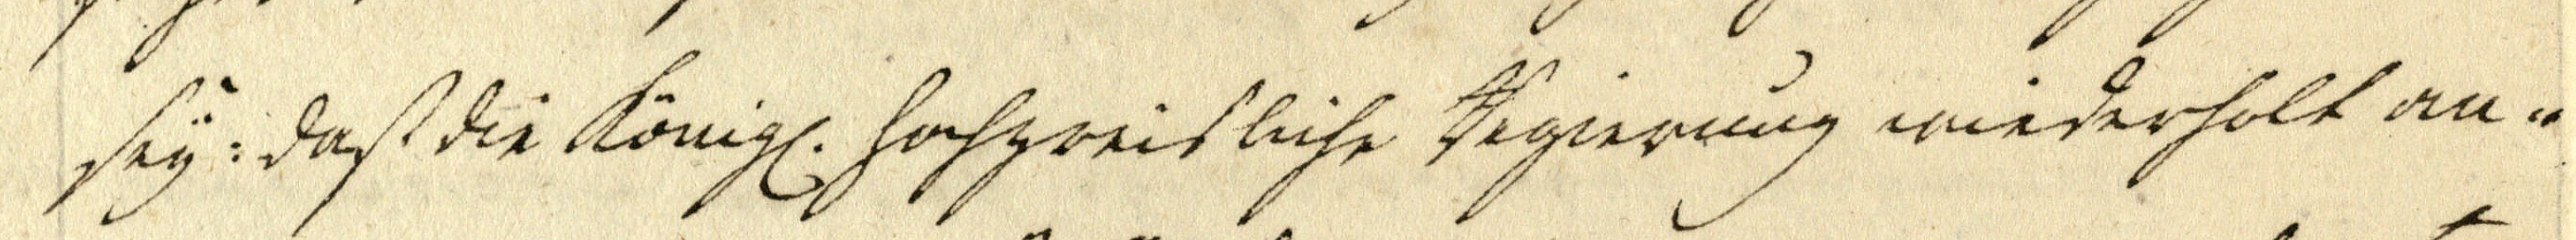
seÿ: daß die Königl. hochpreisliche Regierung wiederholt an¬
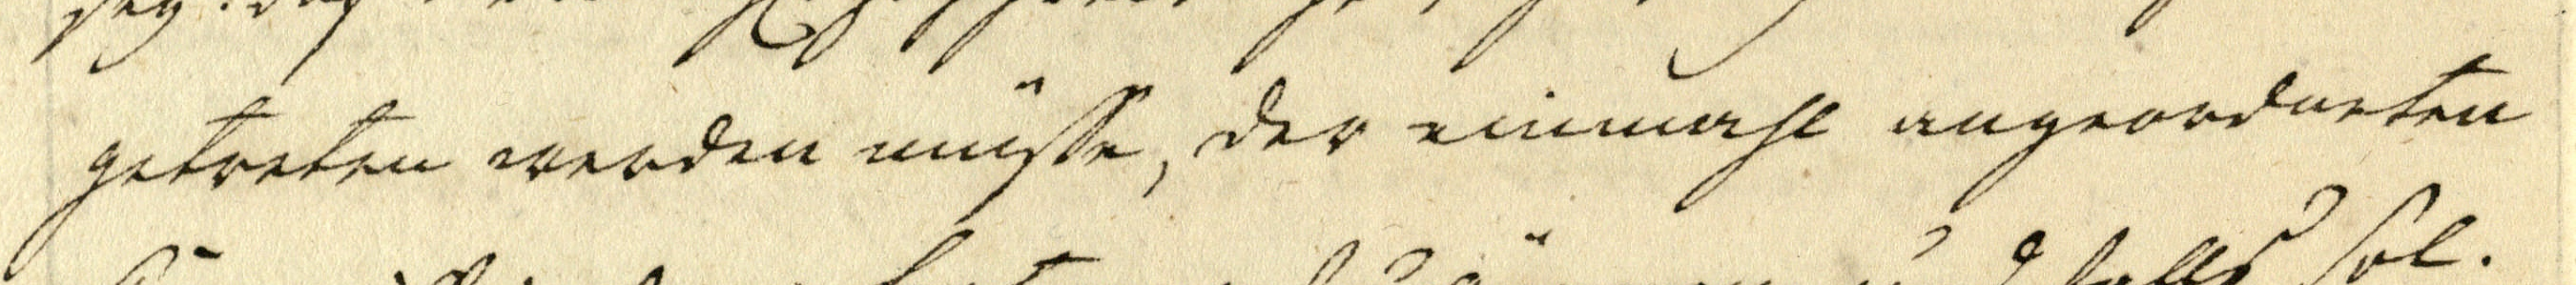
getreten werden müsse, der einmahl angeordneten
